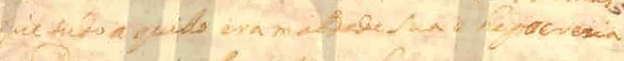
que tudo aquillo era maldade sua e hepocrezia.
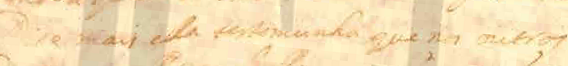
Dise mais ella testemunha que nos outros
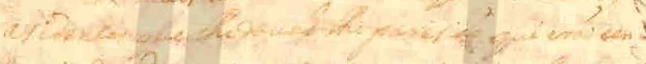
asidentes que lhe dauaõ lhe paresaõ que eraõ ten
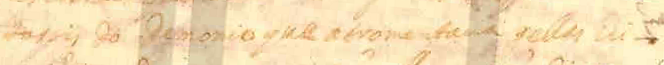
tasois do Demonio que atromentaua pellas ui
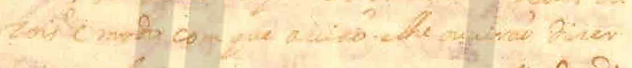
zoĩs e modo com que a uiaõ. e lhe ouuiraõ dizer
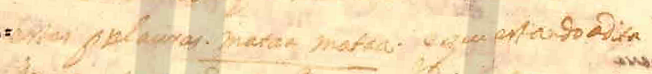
certas palauras. matar matar. e que estando a dita
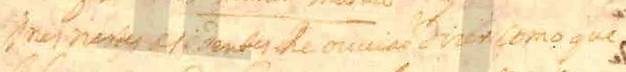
Ines nestes asidentes he ouuiaõ dizer como que
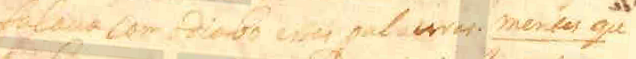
falaua com diabo estas palauras. mentes que
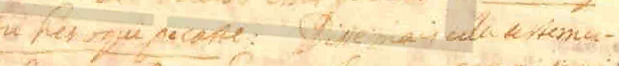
tu hes o que pecaste: Disse mais ella testemu
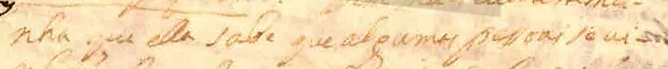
nha que ella sabe que algumas pessoas se ui
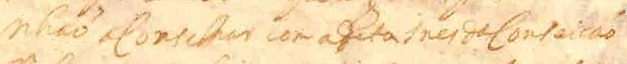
nhaõ aConselhar com a dita ines da Conseiçaõ
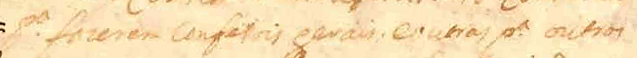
p.a fazerem confisois gerais, e outras p.a outros
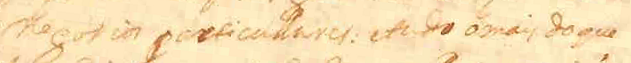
negosios particullares: e tudo o mais do que
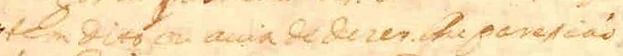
tem dito ou auia de dizer lhe paressiaõ
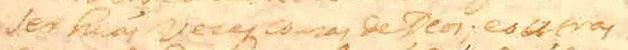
ser huās vezes couzas de Deos, e outras
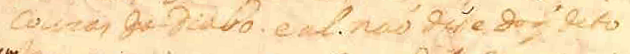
couzas do diabo. e al naõ dise do que dito
